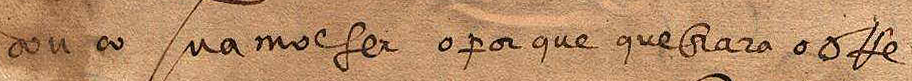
cou cō sua molher o porque quebrara os Re
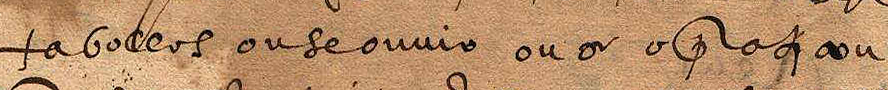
tabollos ou se ouuio ou se o pratjcou
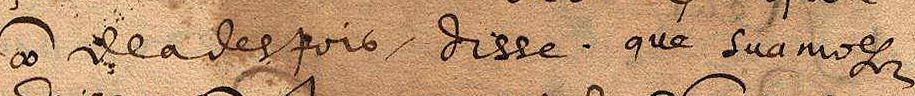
cō ella despois / disse. que sua molher
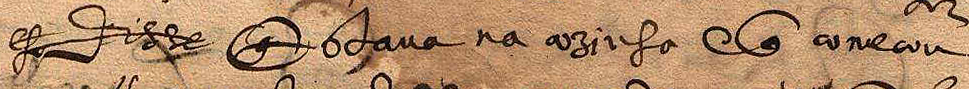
lhe disse q̅ Estaua na cozinha e q̄ comecou
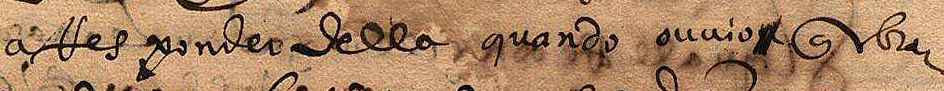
a Responder della quando ouuio _ q̄ebrar
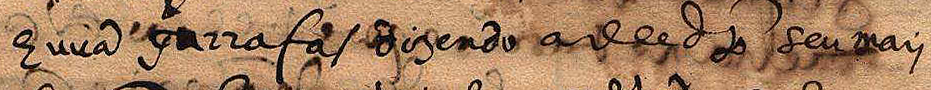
huuā g_rrafa / dizendo a elle dtō seu marj
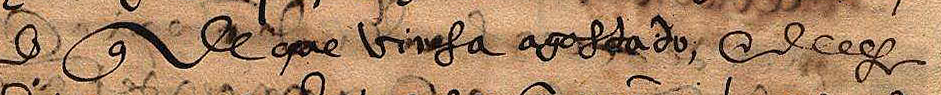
do q̅ ele que vinha agastado, e elle lhe
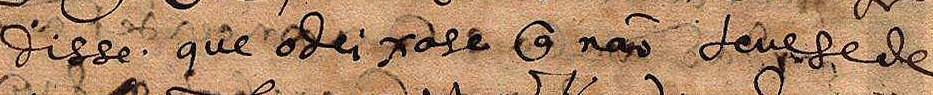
disse. que o deixase q̄ naõ teuese de
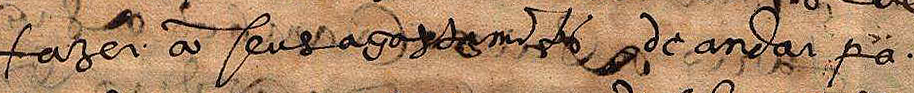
fazer cō seus agastamētos de andar pa
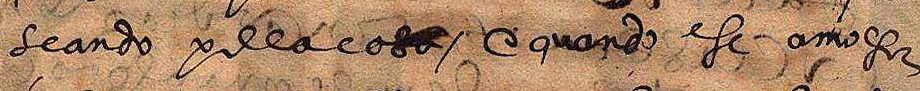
seando pella casa / e quando lhe a molher
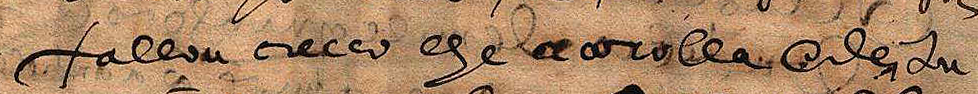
fallou creceo lhe a corolla e deitou
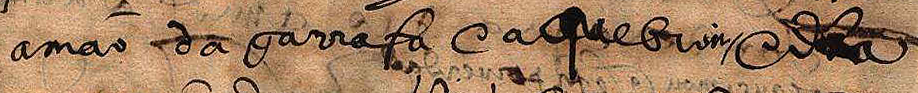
a maõ da garrafa e a quebrou / e _
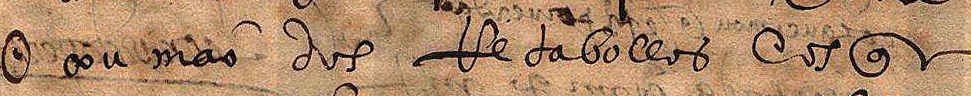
cou maõ dos Retabollos e os q̄e
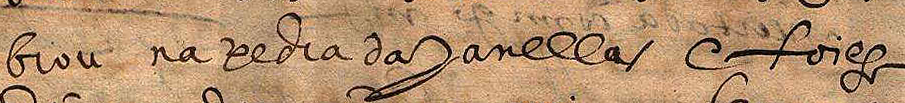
brou na pedra da Janella / e foi lhe
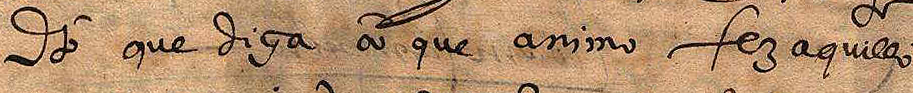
dtō que diga cō que animo fez aquillo
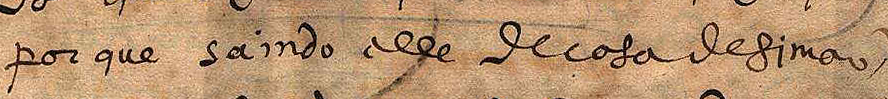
porque saindo elle de casa de simaõ
